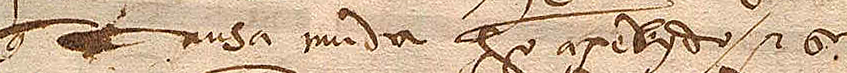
q̄ Causa muda ho apelydo / e se
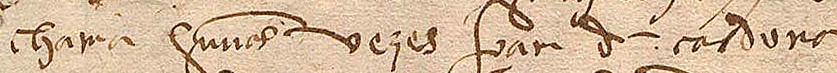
chama hūuas vezes Joam de cardona
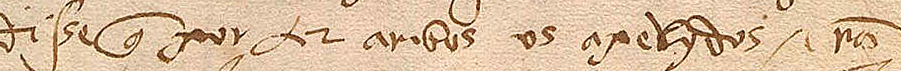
disse q̄ por ter ambos os apelydos e nā
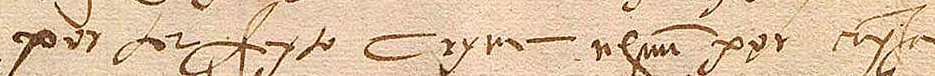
por ter feyto cryme nhūu por cuyJa
